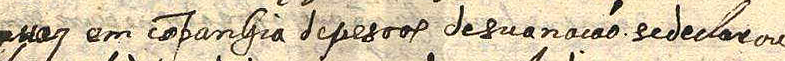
uaz em cōpanhia de pesoas de sua naçaõ se declarou
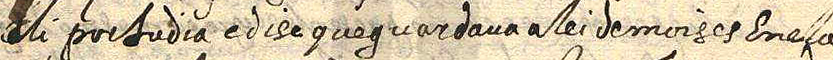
ali por Iudia e dise que guardaua a lei de moises E nela
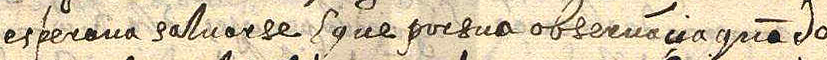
esperaua saluarse E que por sua obseruānçia quādo
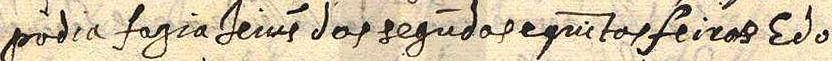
podia fazia Ieiūs das segūdas e quītas feiras E do
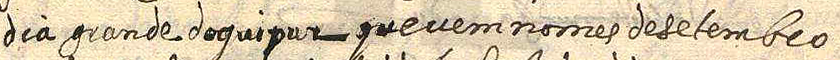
dia grande do quipur que uem no mes de setembro
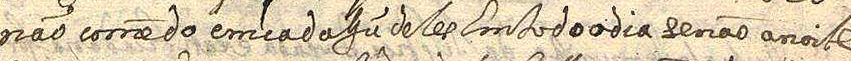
naõ comēdo em cada hū deles Em todo o dia senaõ a noite
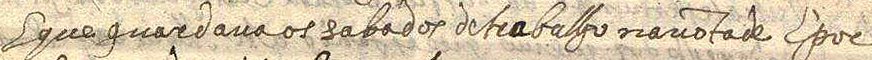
E que guardaua os sabados de trabalho na uōtade E por
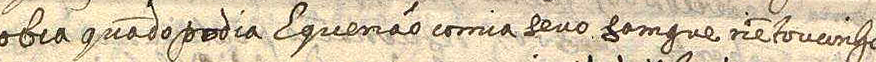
obra quādo podia E que naõ comia seuo samgue nē toucinho
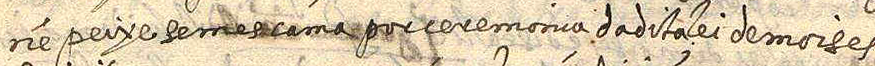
nē peixe sem escama por ceremonia da dita lei de moises
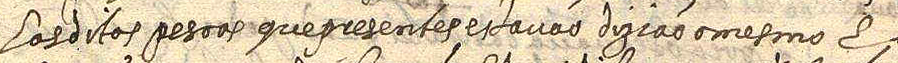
E as ditas pesoas que presentes estauaõ diziaõ o mesmo E
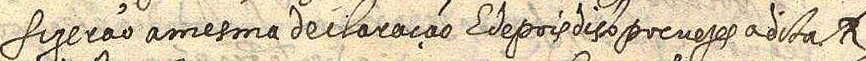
fizerão a mesma declaraçaõ E depois disō por uezes a dita R.
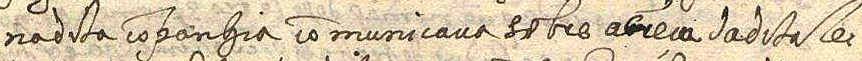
na dita c̄opanhia c̄omunicaua sobre a crēça da dita lei
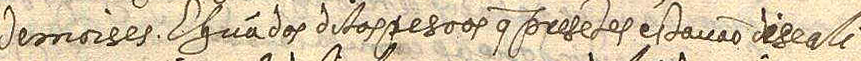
de moises. E huā das ditas pesoas q̄ presētes estauão dise ali
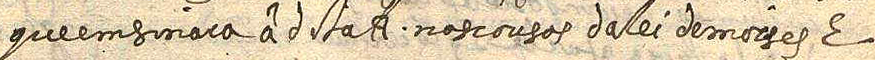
que emsinaua â dita R. nas cousas da lei de moises E
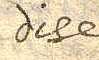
dise
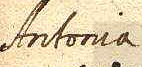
Antonia
